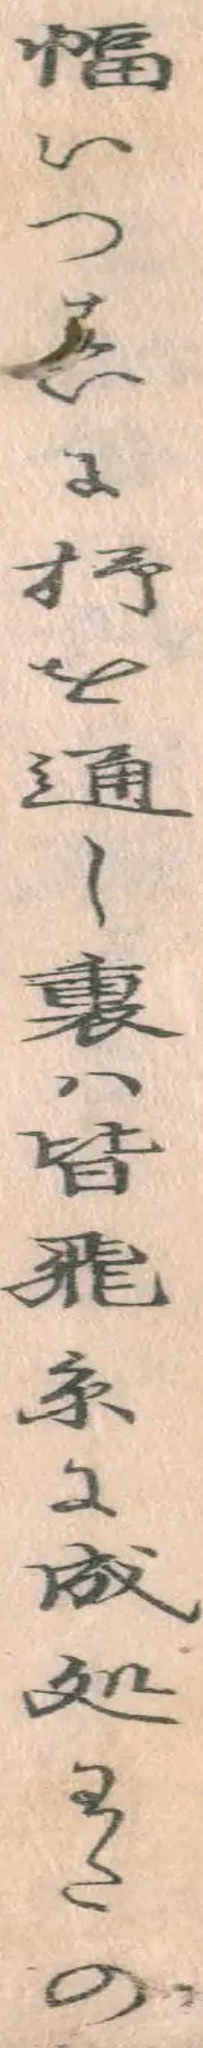幅いつはいに杼を通し裏は皆飛糸に成処わたの
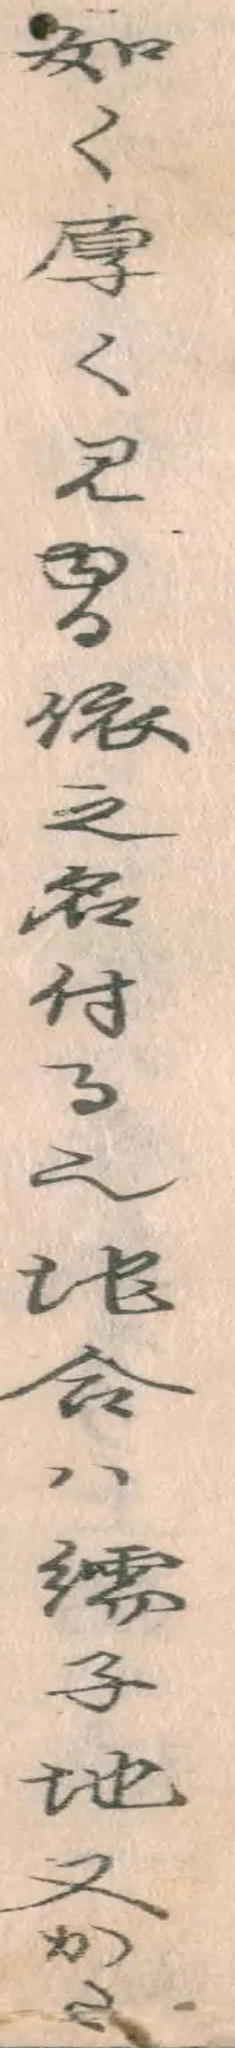如く厚く見ゆる依之名付る也地合は繻子地又かた
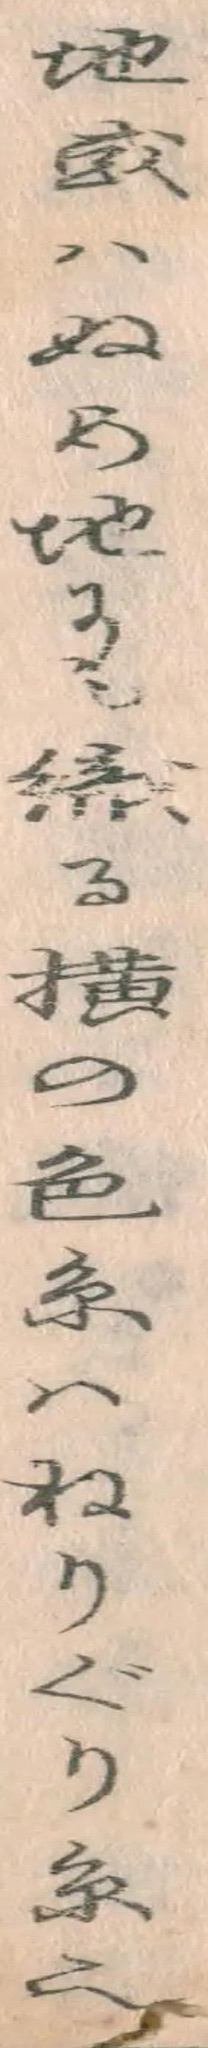地或はぬめ地にも織る横の色糸はねりぐり糸也
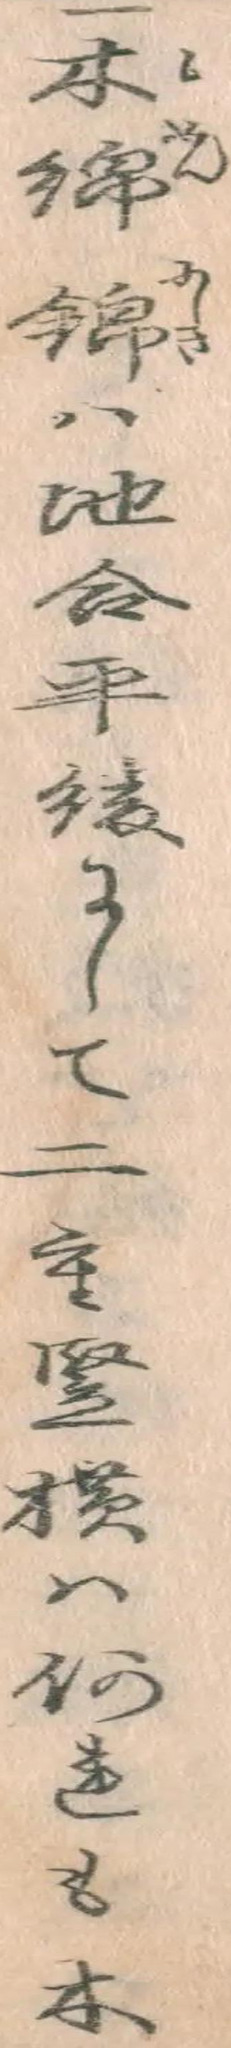一木綿錦は地合平綾にして二重竪横は何れも木
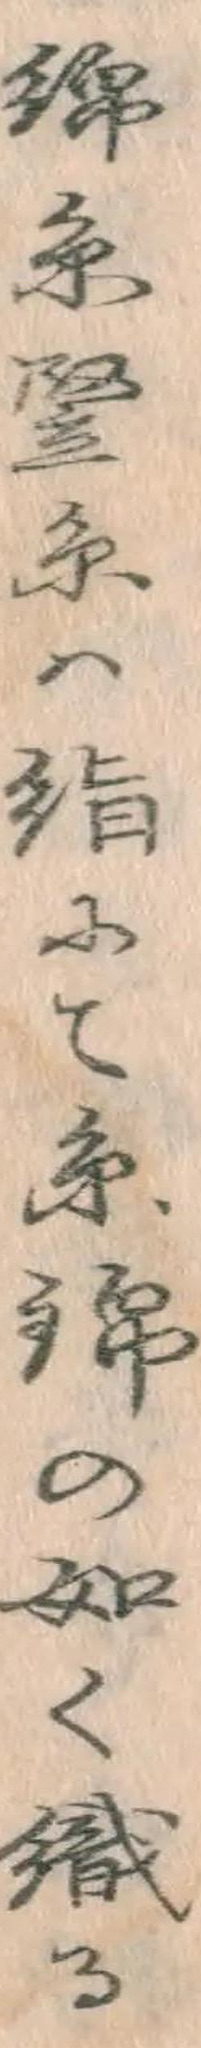綿糸竪糸は𥿻にて糸錦の如く織る

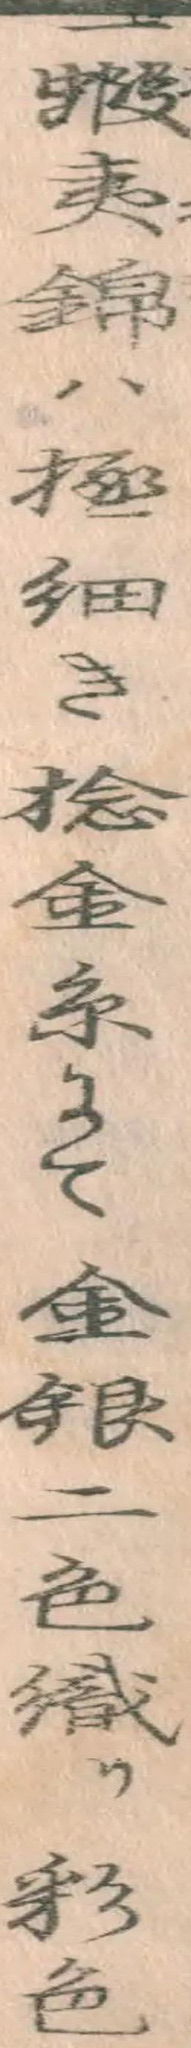一蝦夷錦は極細き捻金糸にて金銀二色織り彩色
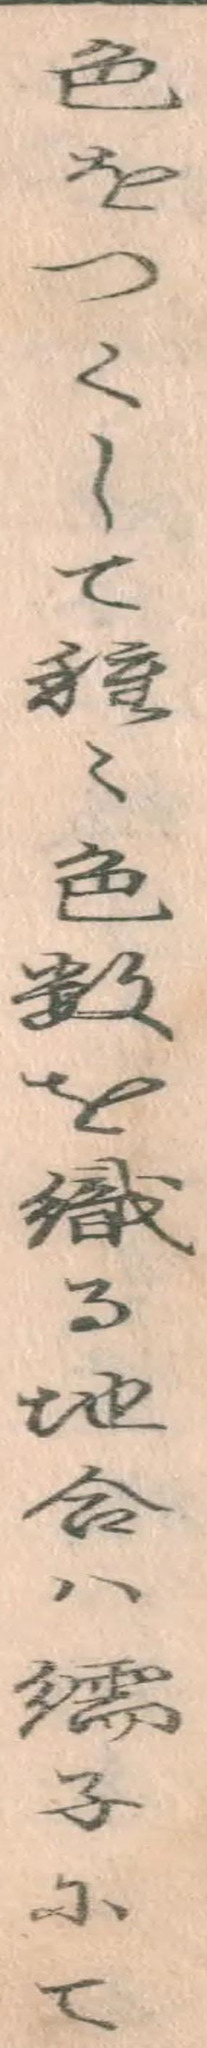色をつくして種々色数を織る地合は繻子にて
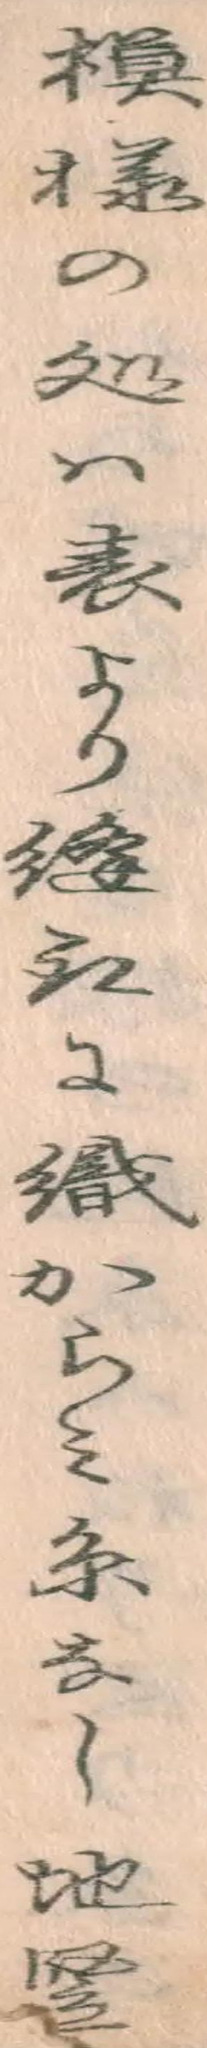模様の処は表より縫取に織からみ糸なし地竪
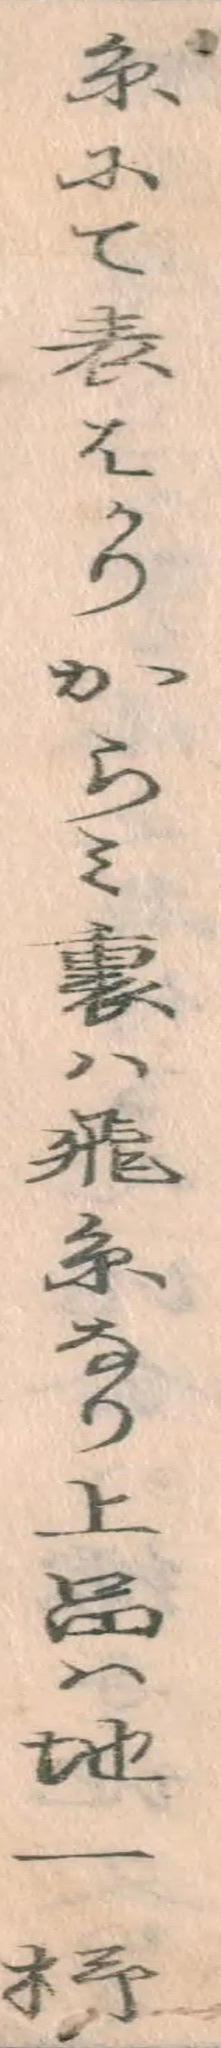糸にて表はかりからみ裏は飛糸なり上品は地一杼
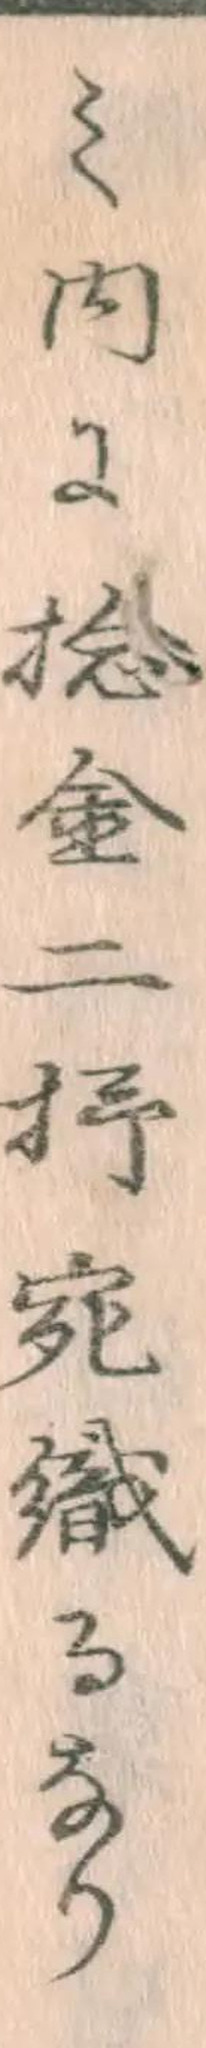之間に捻金二杼宛織るなり
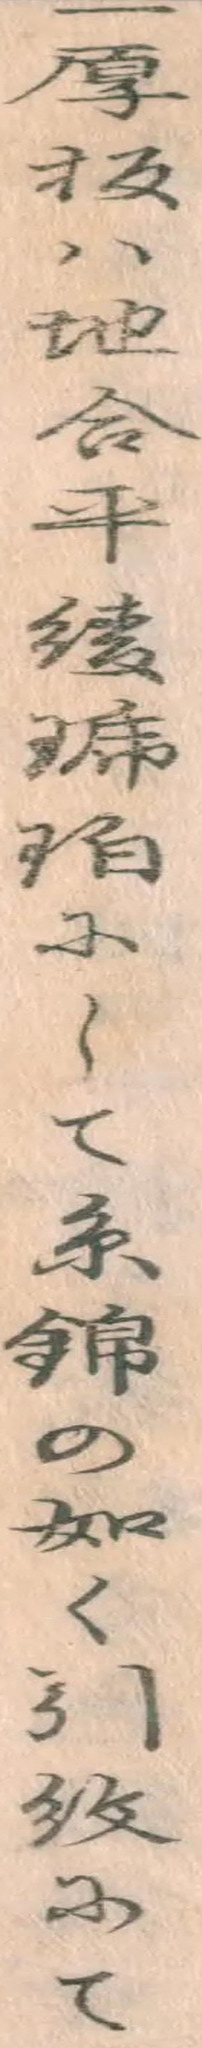一厚板は地合平綾琥珀にして糸錦の如く引紋にて
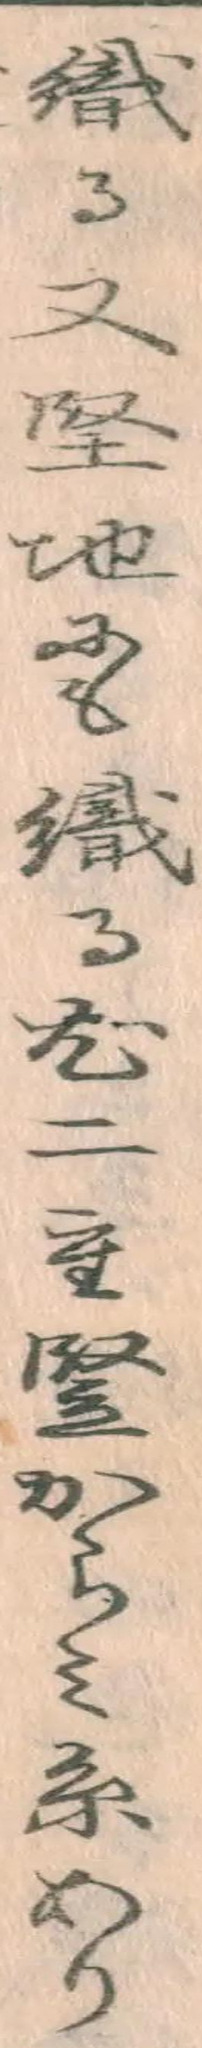織る又堅地にも織る尤二重竪からみ糸あり
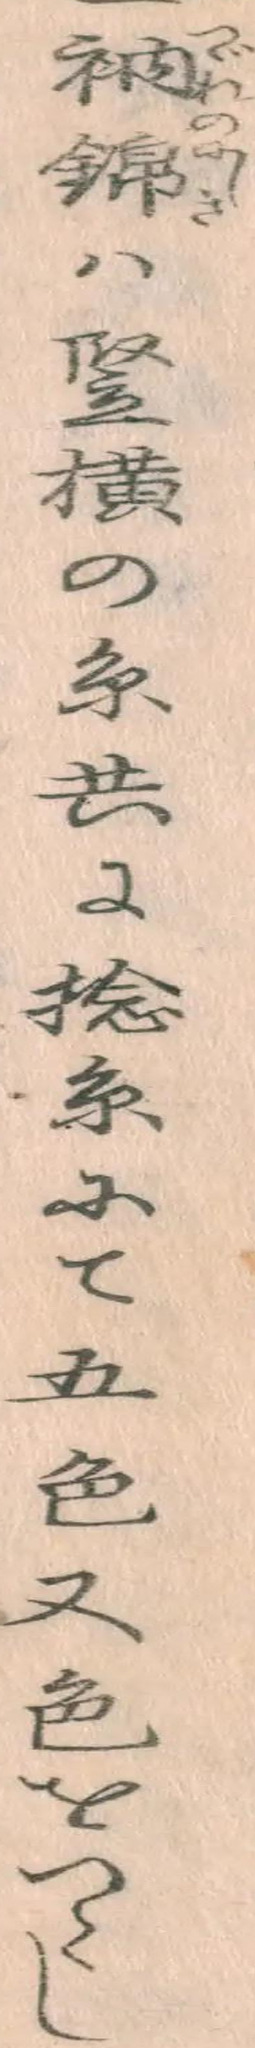一衲錦は竪横の糸共に捻糸にて五色又色をつくし
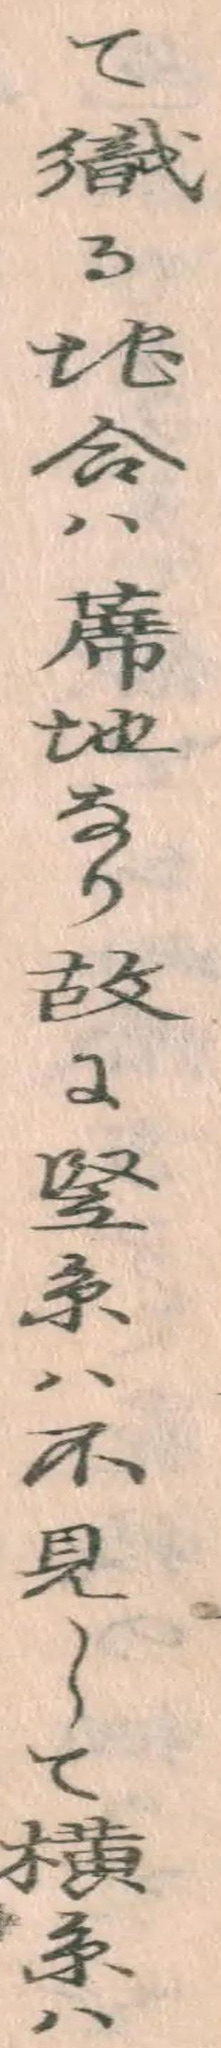て織る地合は蓆地なり故に竪糸は不見して横糸は
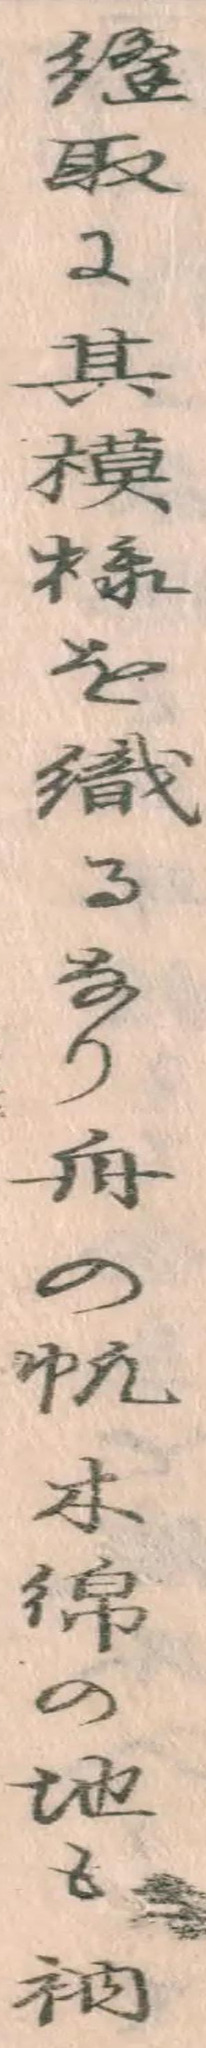縫取に其模様を織るなり舟の帆木綿の地も衲
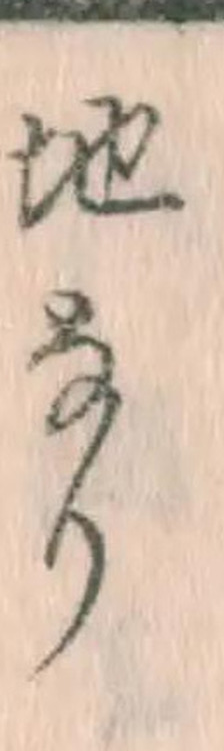地なり
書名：機織彙編 5巻. [2]
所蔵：国立国会図書館 National Diet Library, JAPAN
